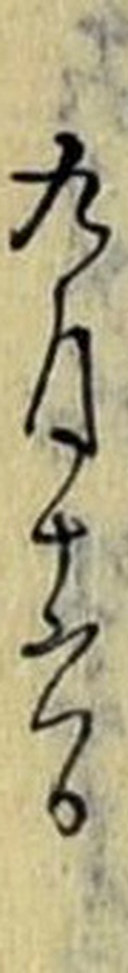九月十六日
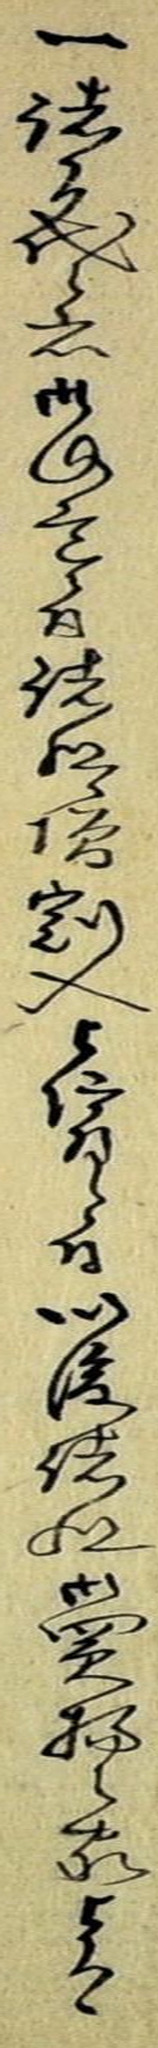一諸下代之者御趣意に付諸組へ増割入被仰付候に付以後諸組御買揚之家被下候
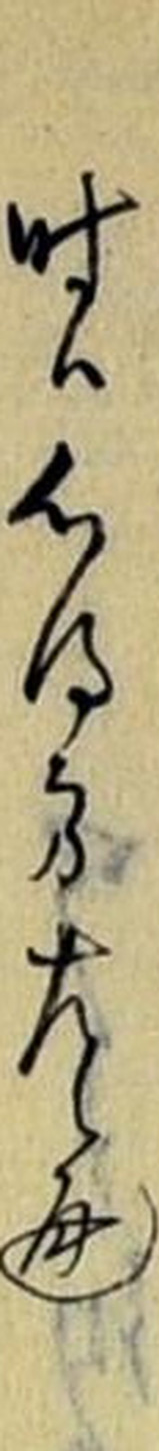時は心得方左之通
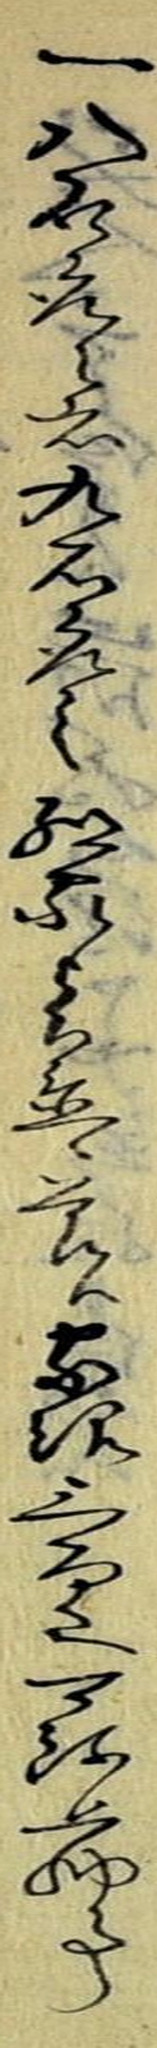一八石取之者九石取之組家被下置候節は家銀三百匁可致上納事
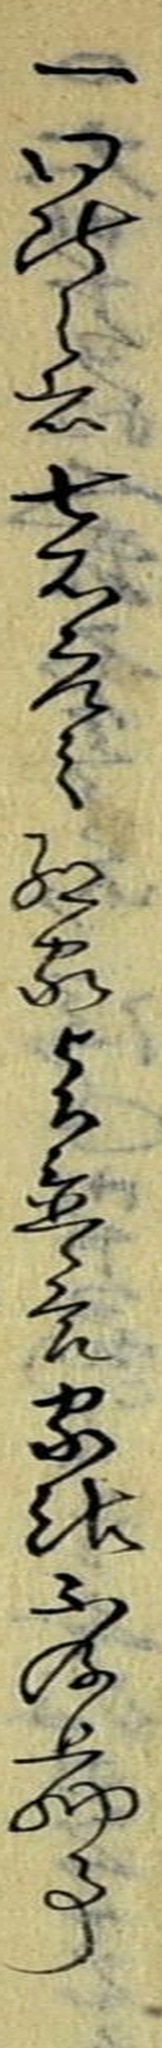一同断之者七石取之組家被下置候節家銀不及上納事
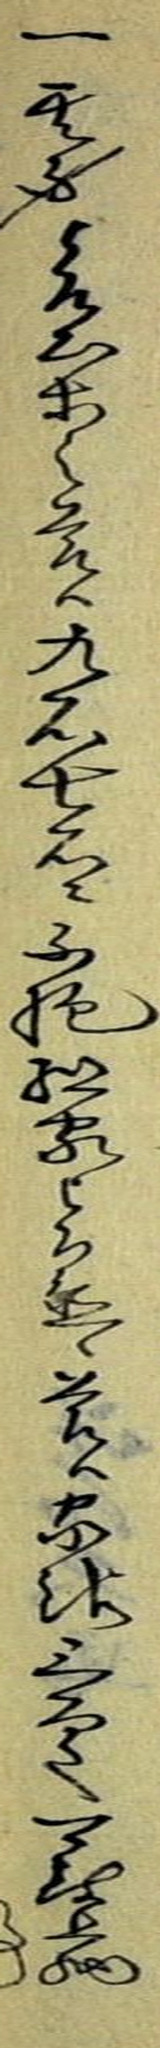一其身被召出等之節は九石七石に不拘組家被下置候節は家銀三百匁可致上納事
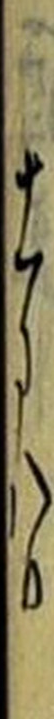十一月八日
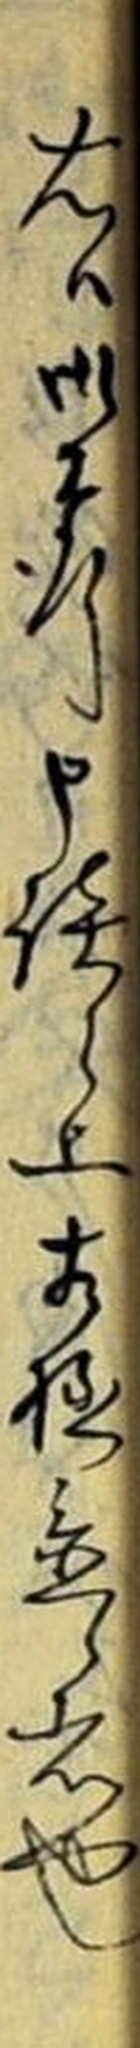右は御奉行申談之上相極置候者也
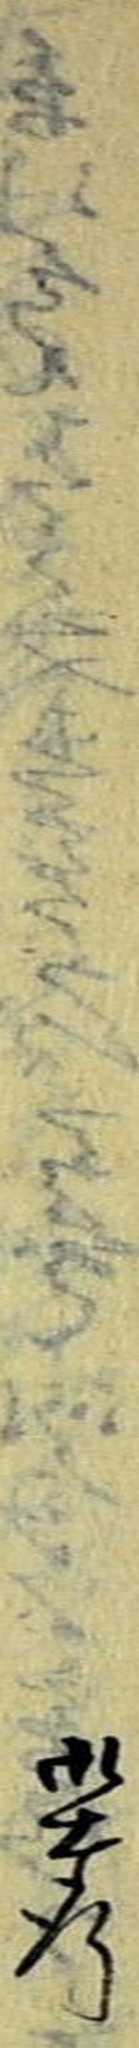御奉行
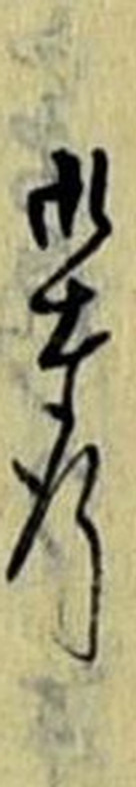御奉行
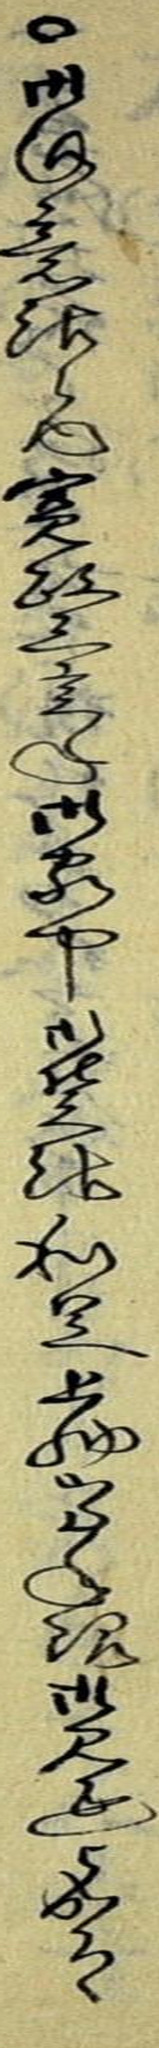○御趣意銀之内寛政三亥年御家中御貸銀利息上納当年銀御見延被成下候
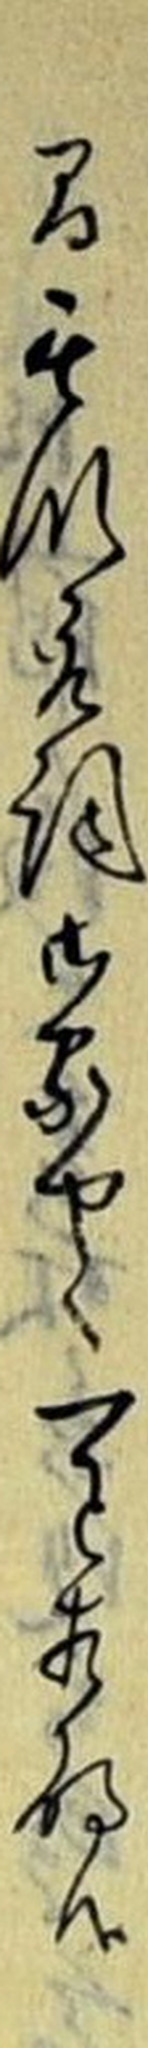間其段取調御家老中へ可被相触候
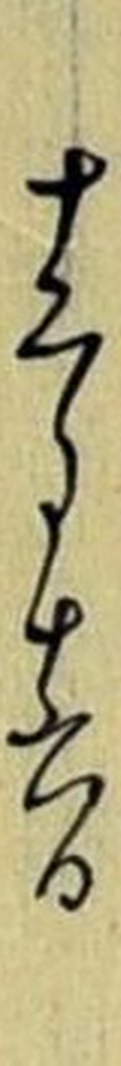十二月十六日

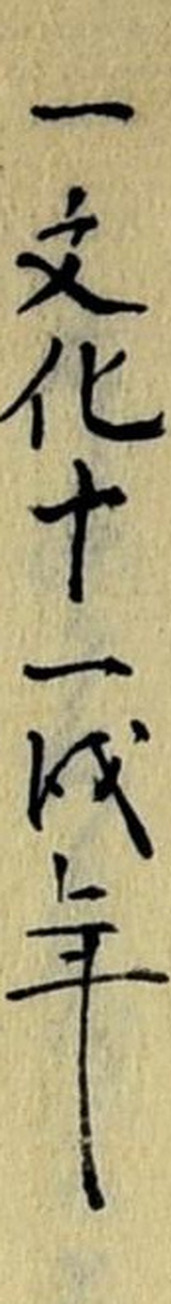一文化十一戌年
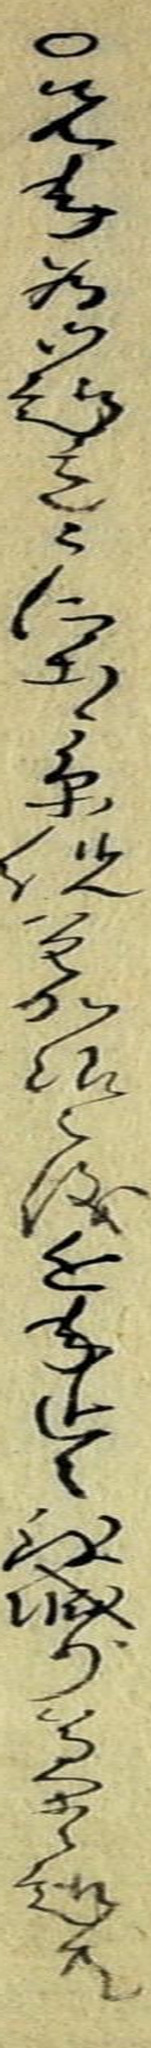○先年為御趣意被仰出候糸繭冥加銀之儀近年追々致減少等閑之趣共
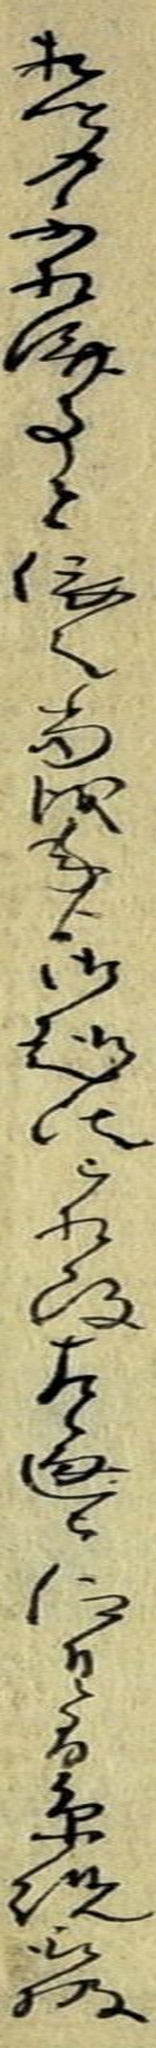相聞不相済事に候依之当戌年ゟ御趣法被相改左之通被仰付候に付糸繭取扱
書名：命令之部 四
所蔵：福井県文書館 Fukui Prefectural Archives
